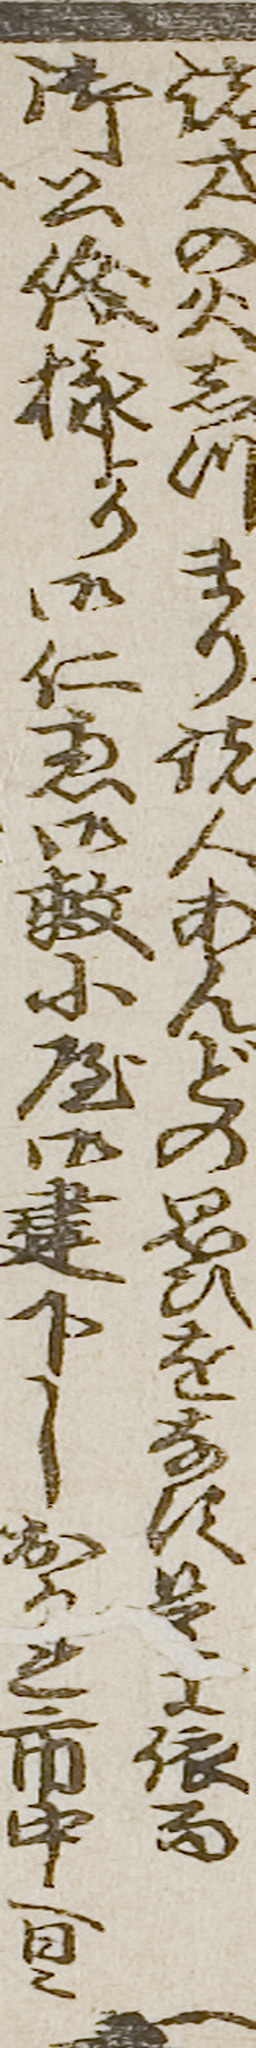御公儀様より御仁恵御救小屋御建下しおかれ市中へ日々
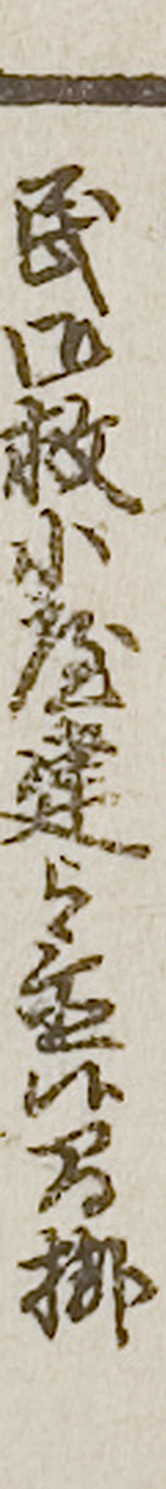民御救小屋建被置候間掛
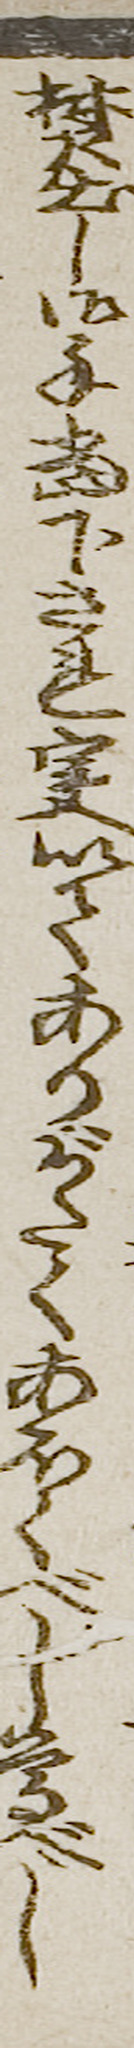焚出し御手当下され実以てありがたくあほくべし尊べし
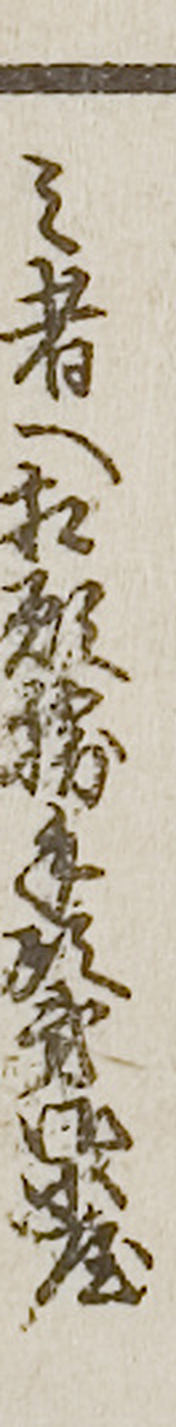之者へ相願勝手次第御小屋
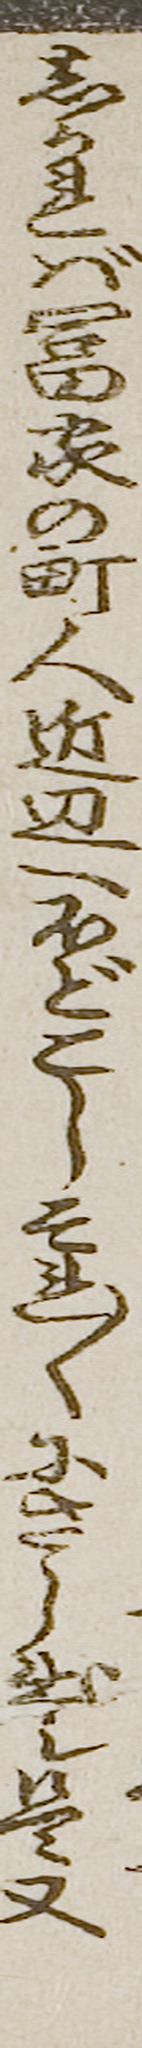しかれば富家の町人近辺へほどこしそれ〳〵にさし出し是又
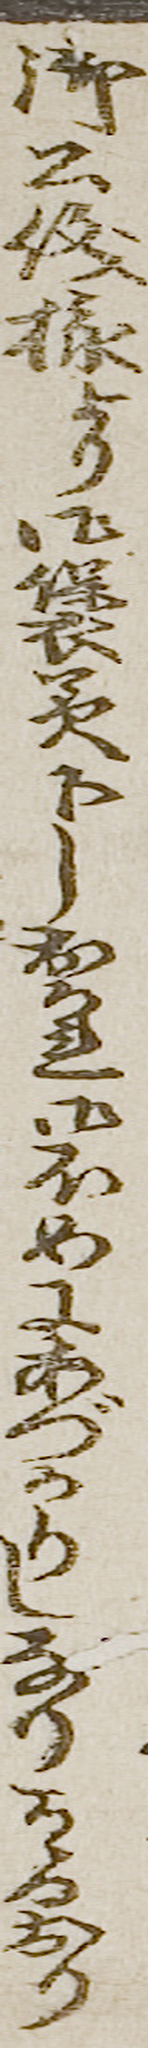御公儀様より御褒美下しおかれ御ほめにあづかりしなりかゝるおり
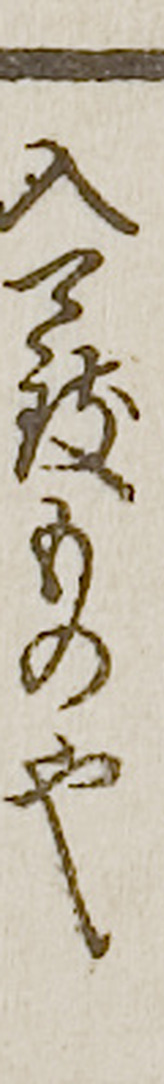入可致もの也
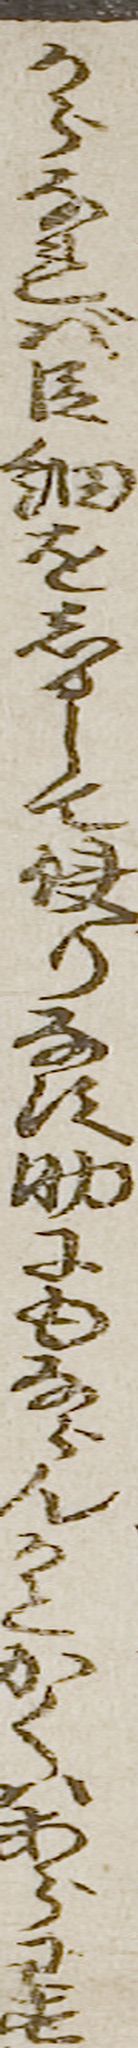からなれば巨細をしるして便りなす助にもならんかとかくはあらわす也
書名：安政改正泰平盤石図会
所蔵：東京大学総合図書館 General Library in the University of Tokyo, JAPAN
